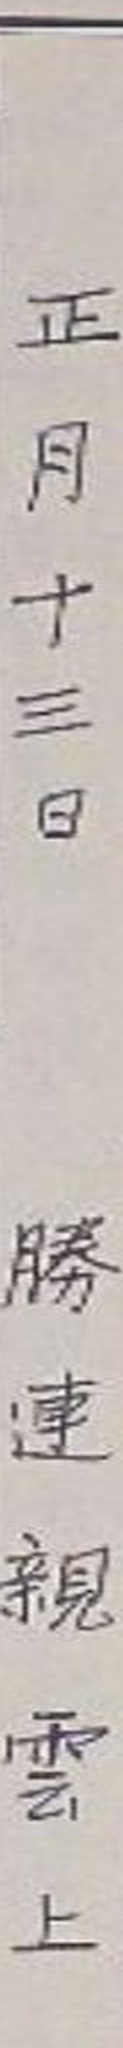正月十三日勝連親雲上
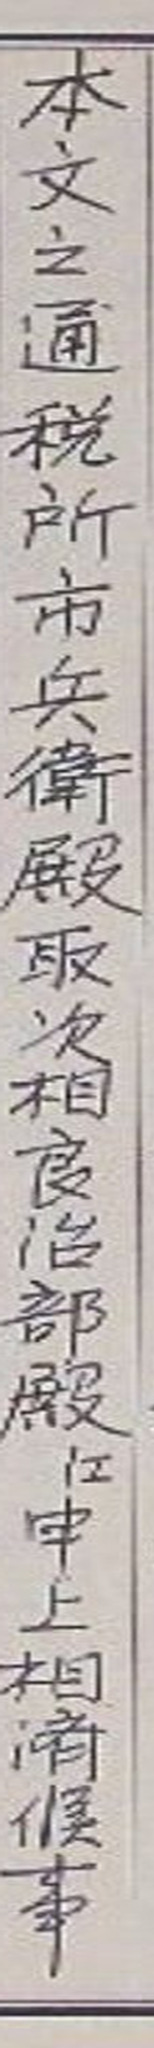本文之通税所市兵衛殿取次相良治部殿え申上相済候事
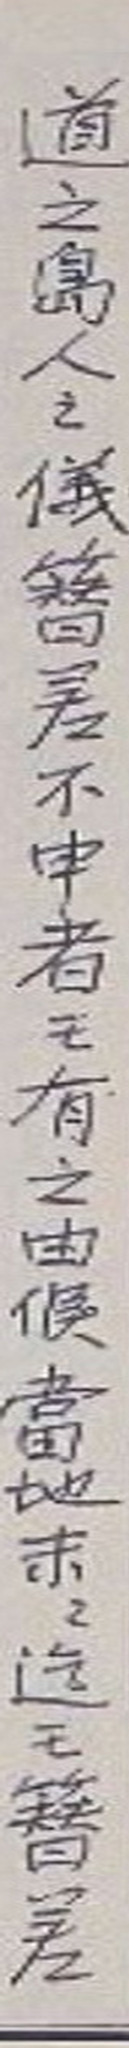道之島人之儀簪差不申者も有之由候当地末々迄も簪差
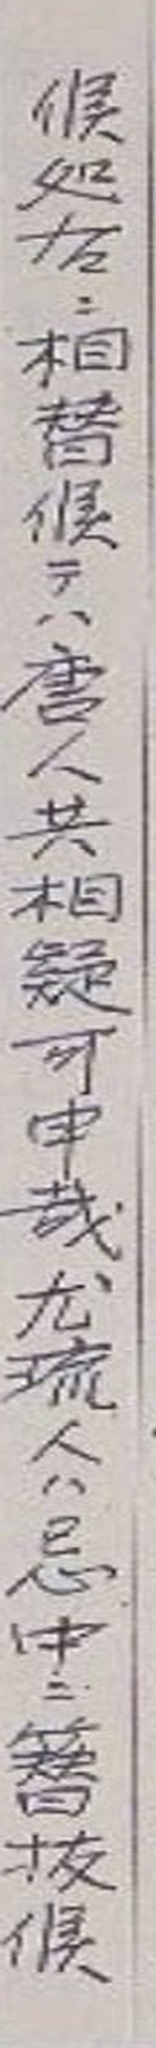候処右に相替候ては唐人共相疑可申哉尤琉人は忌中に簪抜候
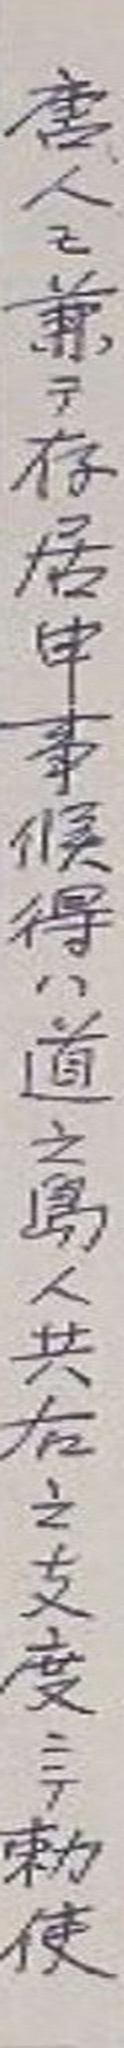唐人も兼て存居申事候得は道之島人共右之支度にて勅使
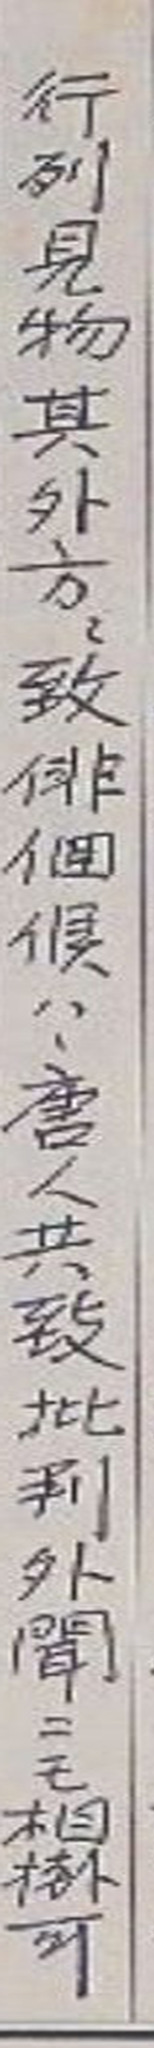行列見物其外方々致徘徊候はゝ唐人共致批判外聞にも相掛可
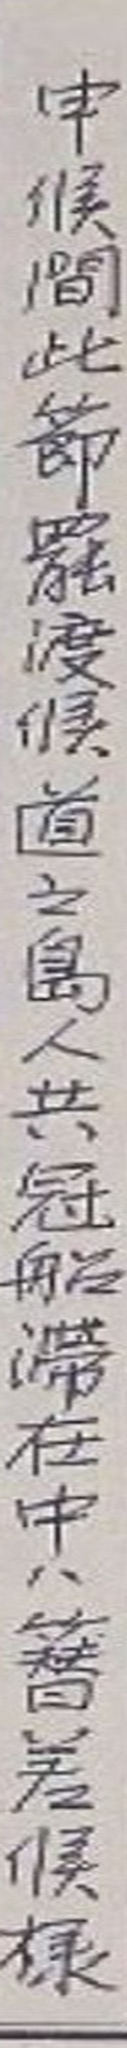申候間此節罷渡候道之島人共冠船滞在中は簪差候様
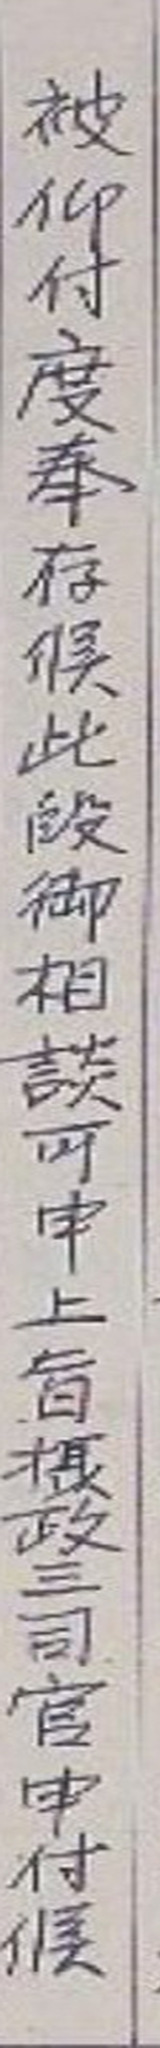被仰付度奉存候此段御相談可申上旨摂政三司官申付候
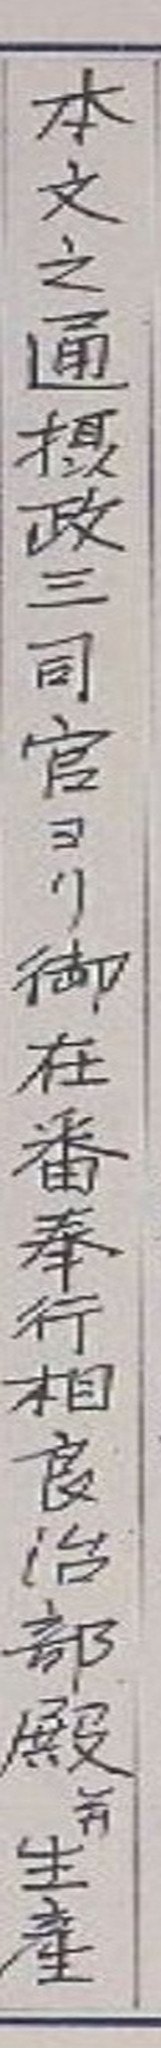本文之通摂政三司官より御在番奉行相良治部殿并生産
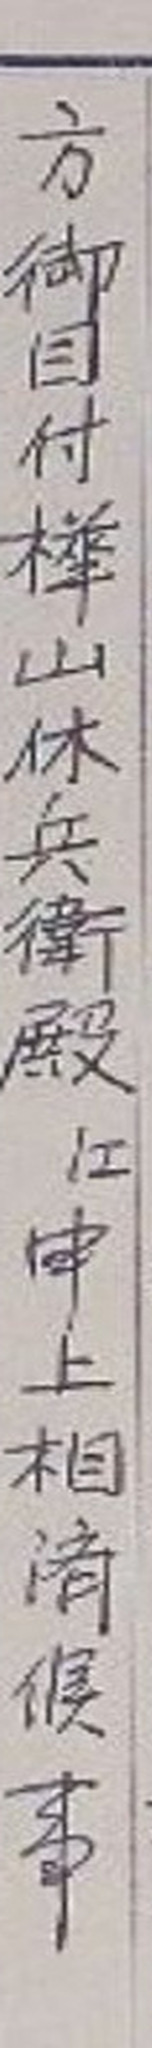方御目付樺山休兵衛殿え申上相済候事

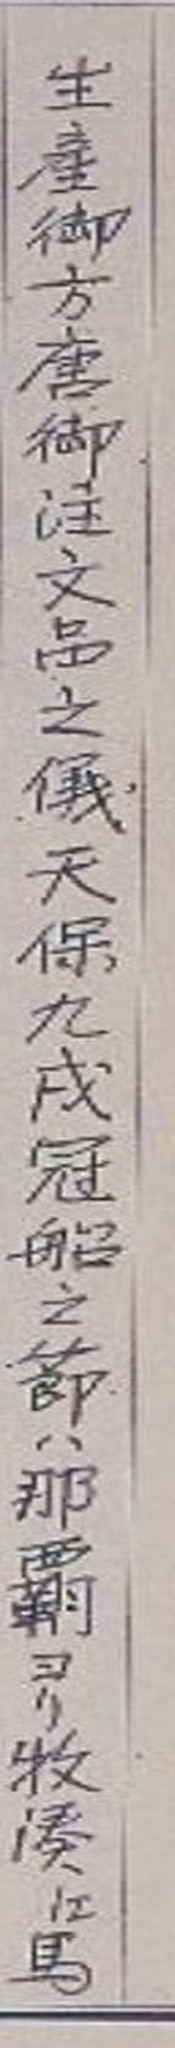生産御方唐御注文品之儀天保九戌冠船之節は那覇より牧湊え馬
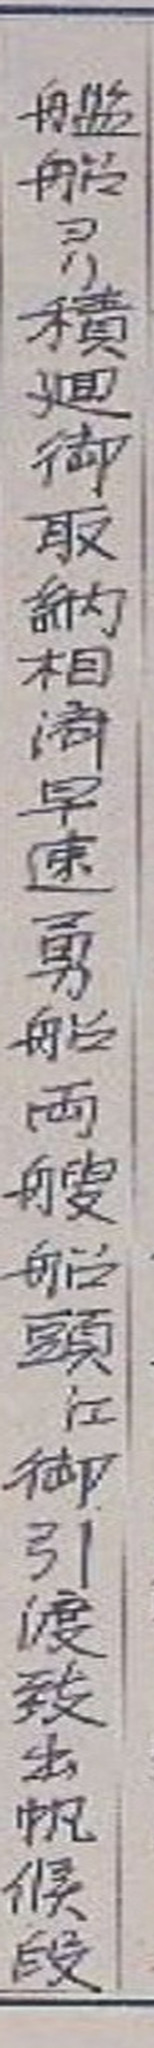艦船より積廻御取納相済早速勇船両艘船頭え御引渡致出帆候段
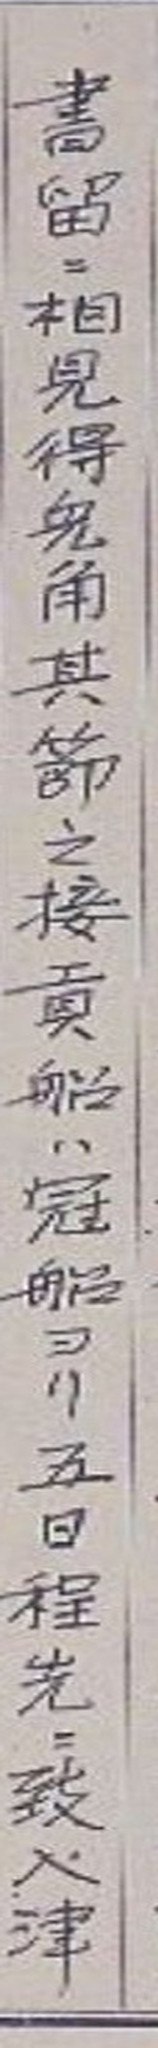書留に相見得兎角其節之接貢船は冠船より五日程先に致入津
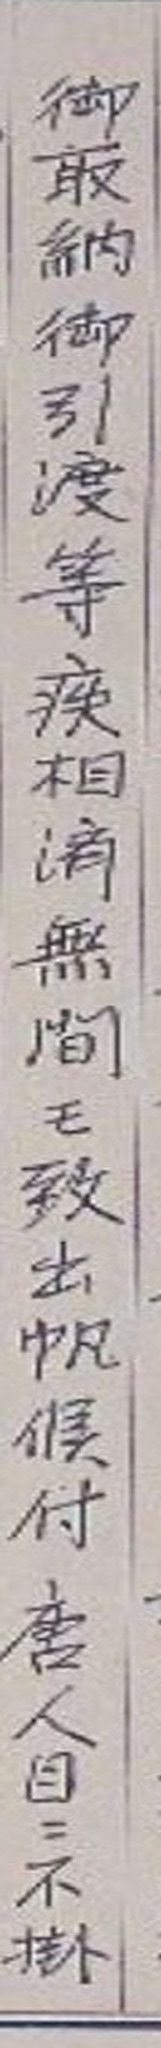御取納御引渡等疾相済無間も致出帆候付唐人目に不掛
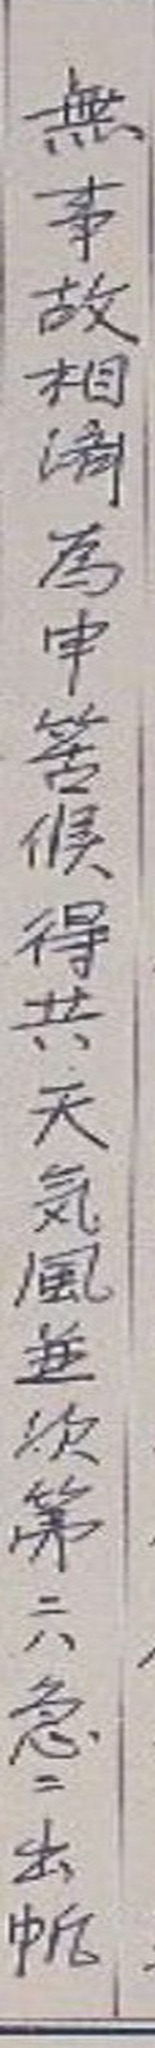無事故相済為申筈候得共天気風並次第には急に出帆
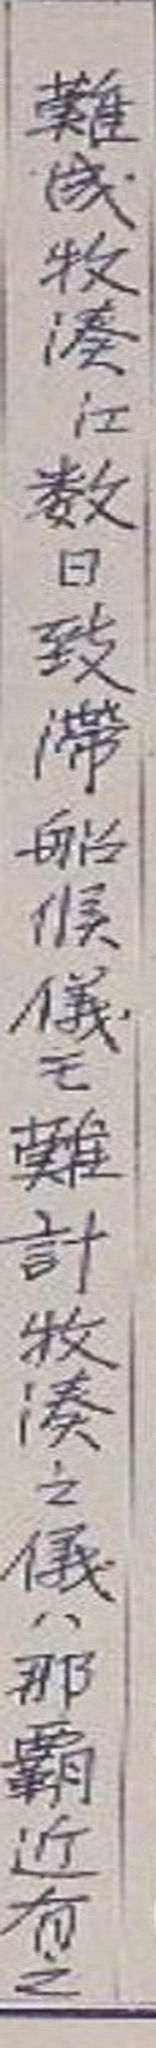難成牧湊え数日致滞船候儀も難計牧湊之儀は那覇近有之
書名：支那冊封使来琉諸記 下巻
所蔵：University of the Ryukyus Library
